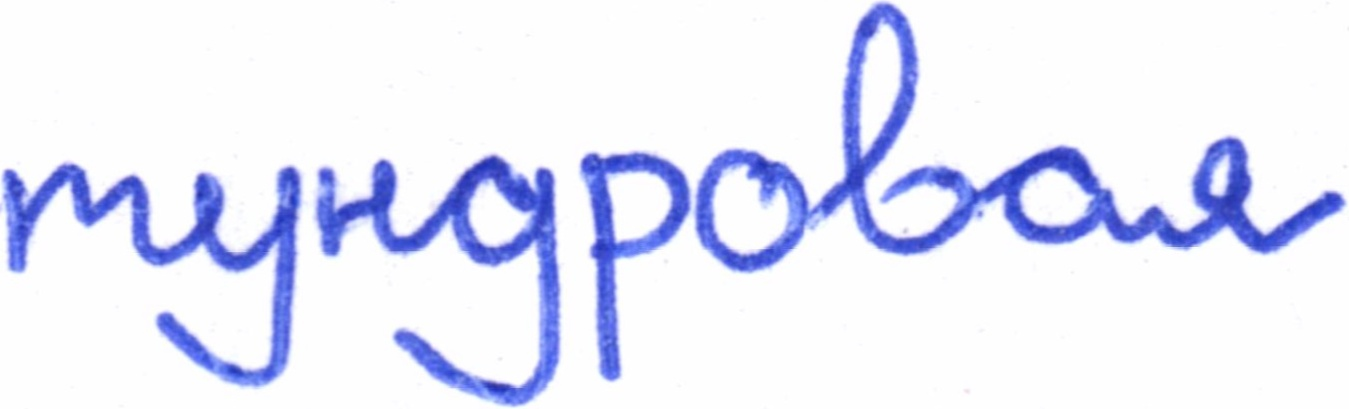тундровая
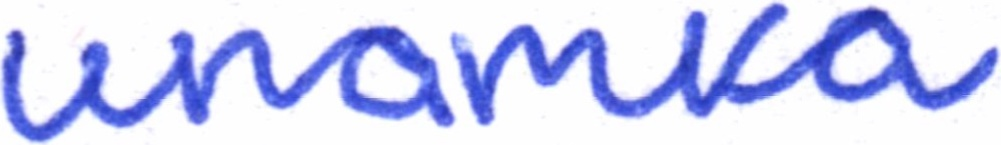ипатка
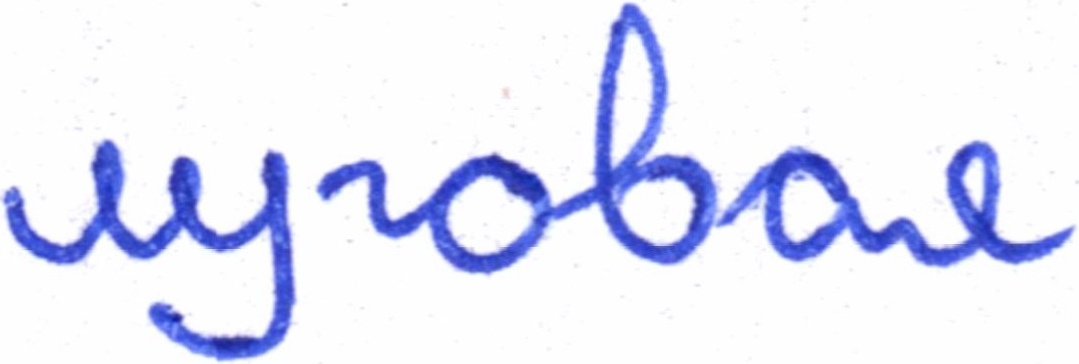луговая
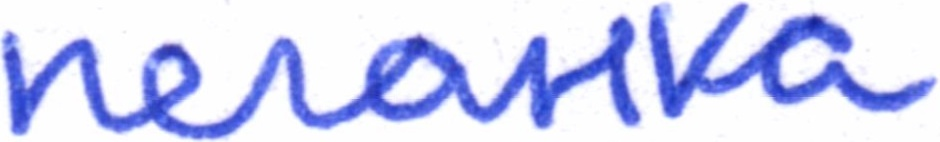пеганка
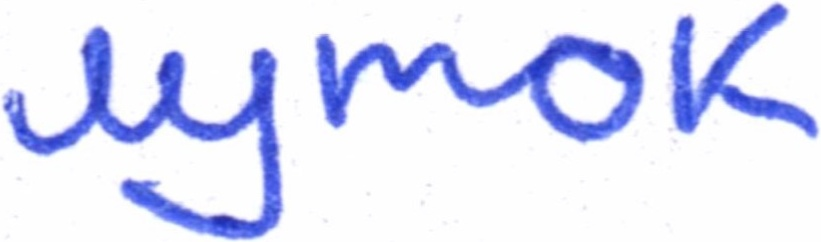луток
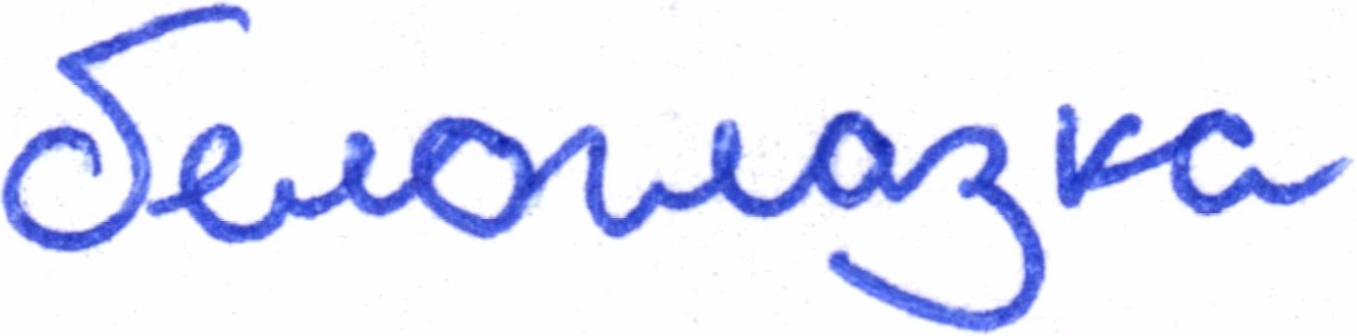белоглазка
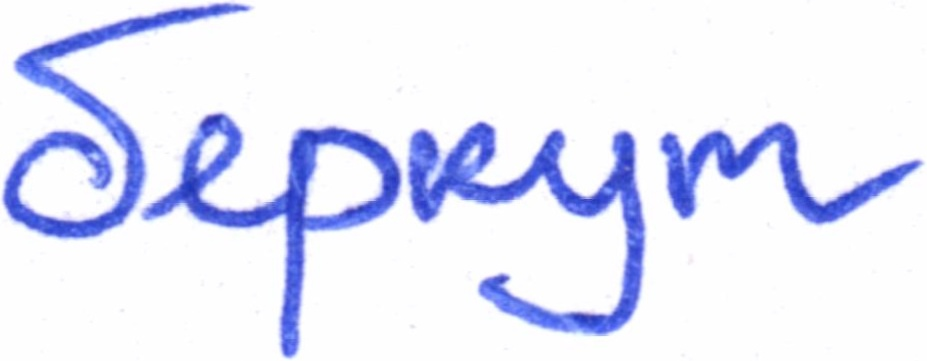беркут
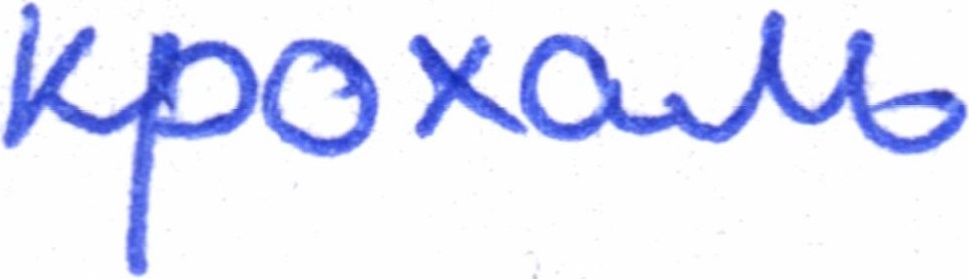крохаль
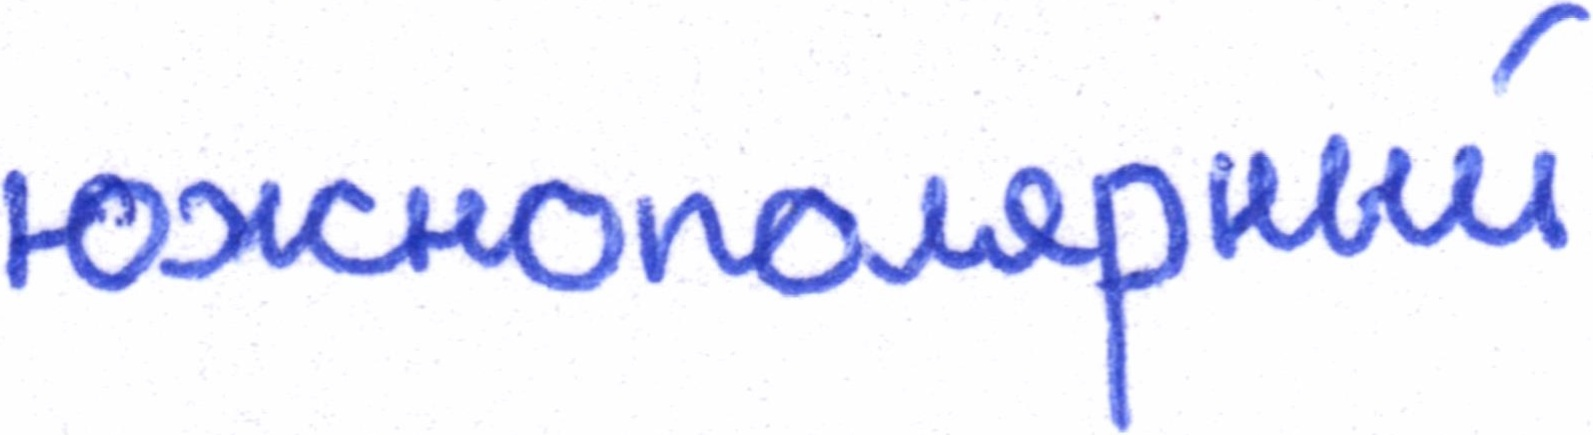южнополярный
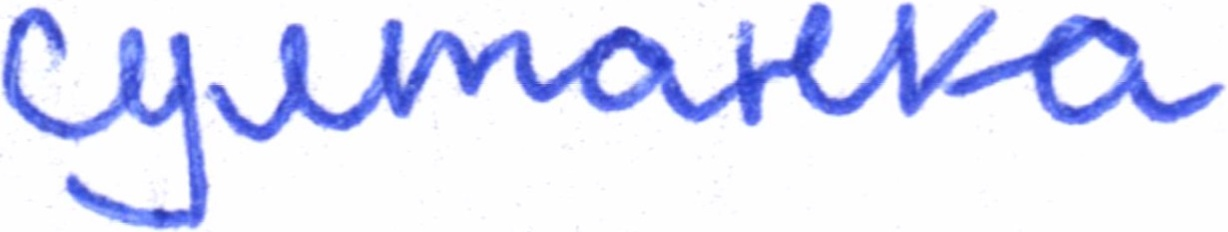султанка
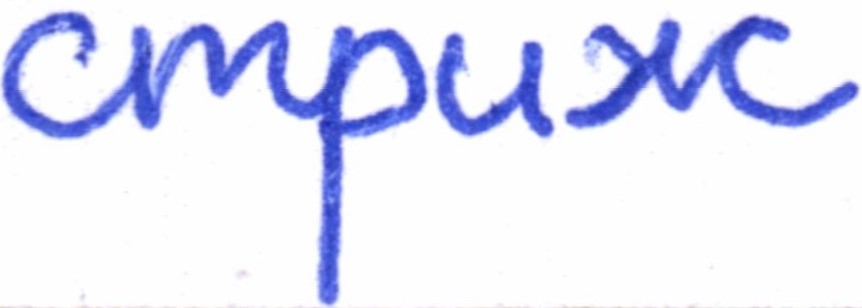стриж
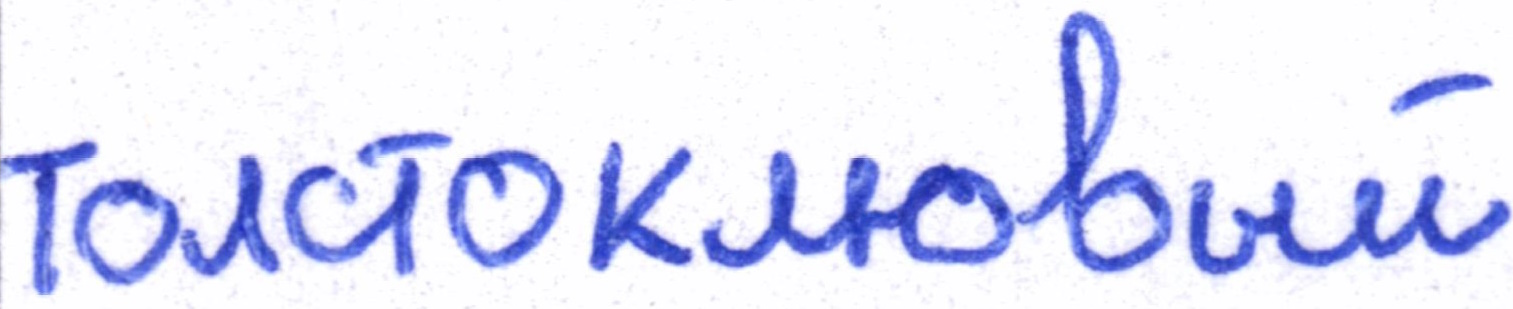толстоклювый
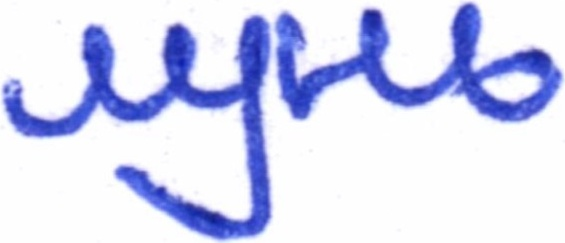лунь
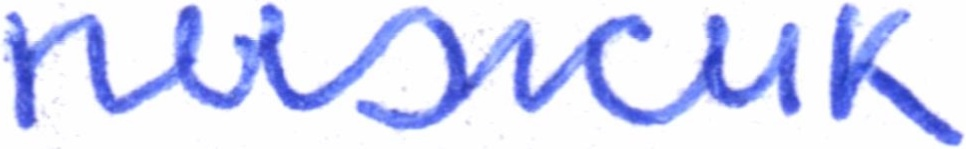пыжик
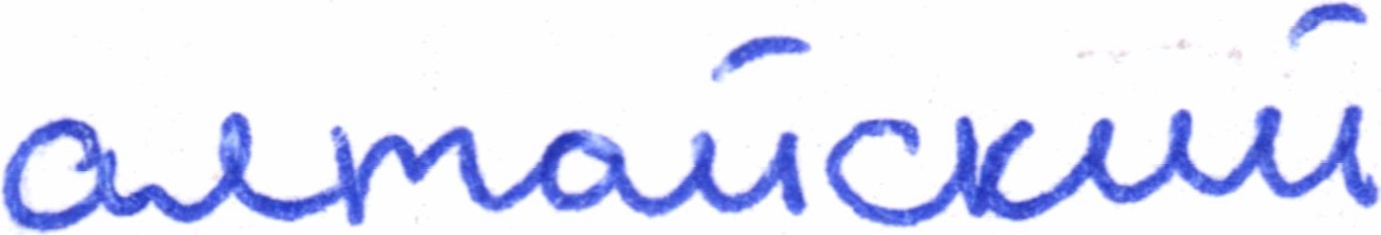алтайский
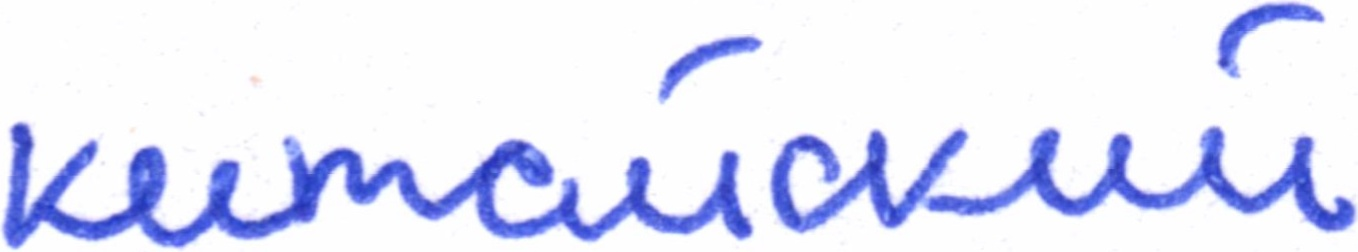китайский
